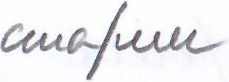старик
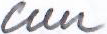сип
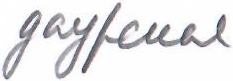даурская
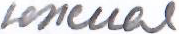южная
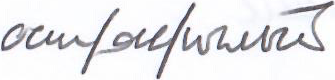острокрылый
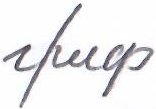гриф
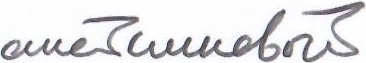ошейниковый
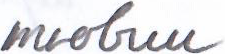тювик
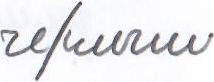черныш
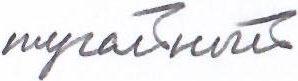тугайный
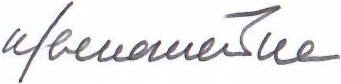красношейка
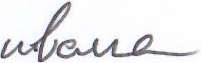иволга
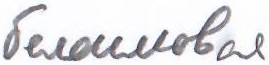белоклювая
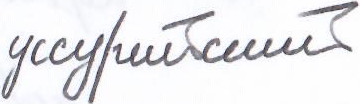уссурийский
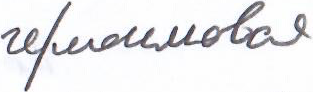черноклювая
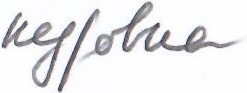кедровка
